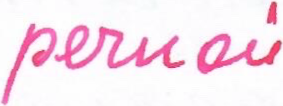речной
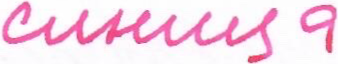синица
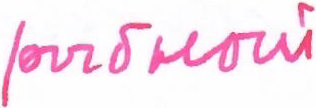рыбный
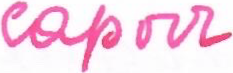сарыч
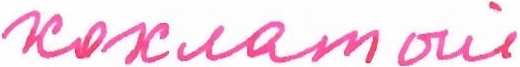хохлатый
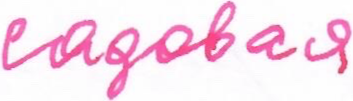садовая
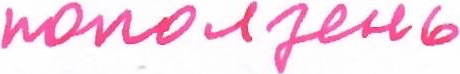поползень
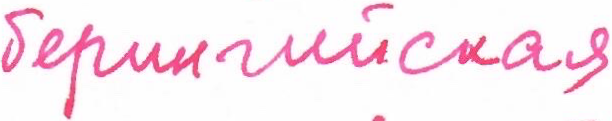берингийская
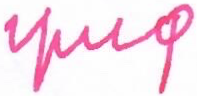гриф
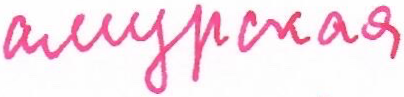амурская
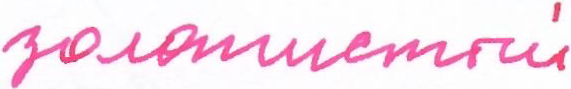золотистый
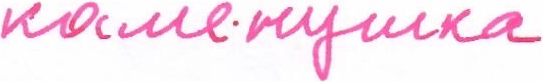каменушка
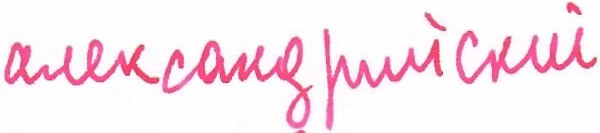александрийский
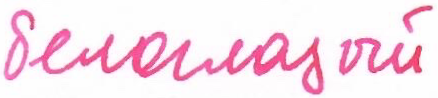белоглазый
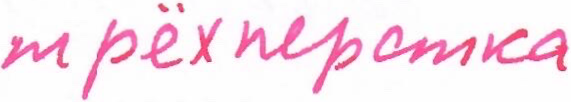трёхперстка
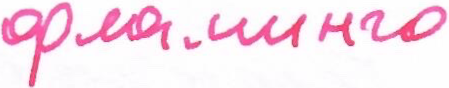фламинго
